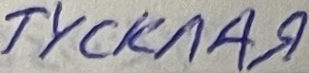тусклая
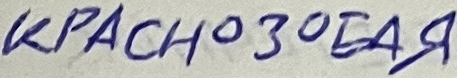краснозобая
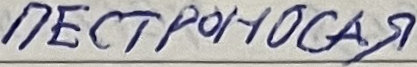пестроносая
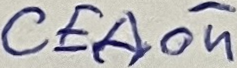седой
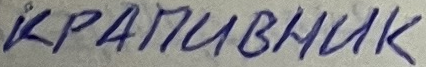крапивник
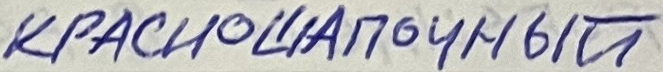красношапочный
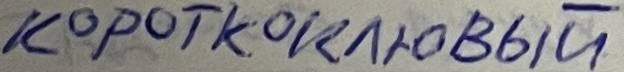короткоклювый
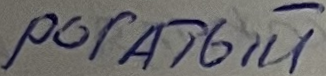рогатый
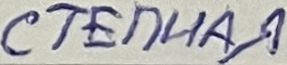степная
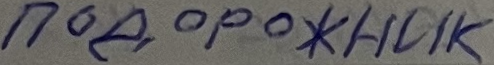подорожник
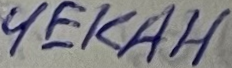чекан
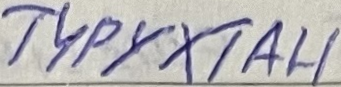турухтан
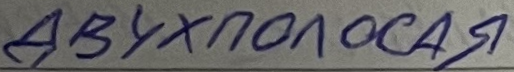двухполосая
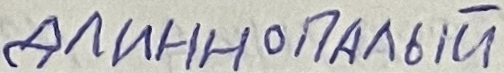длиннопалый
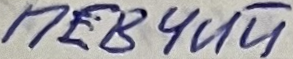певчий
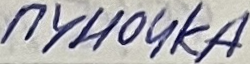пуночка
